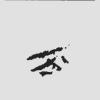{文一}
